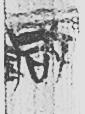戕
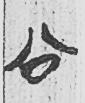公
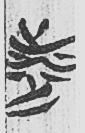涉
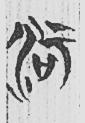河
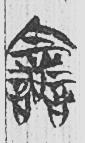{宀言言言}
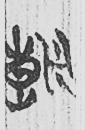朝
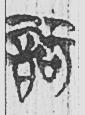訶
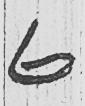㠯（以）
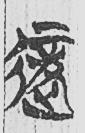復
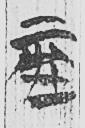坪
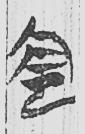侌
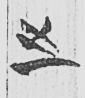之
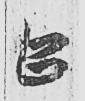𠂤
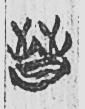晉
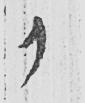人
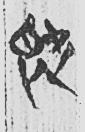既
